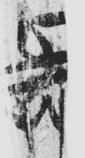與
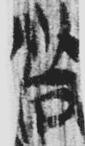級（隰）
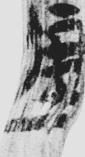○（朋）
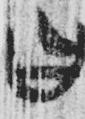曰
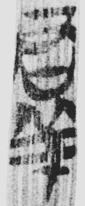群
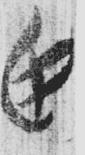臣
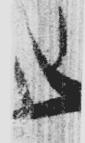之
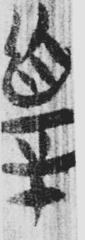○（罪）
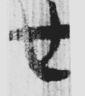也
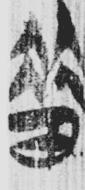昔
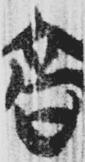高
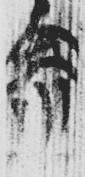宗
